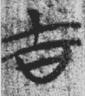吉
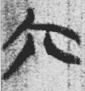六
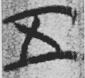五
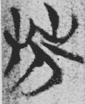芬（豶）
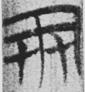豕
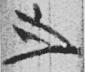之
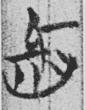○（牙）
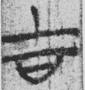吉
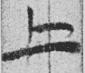上
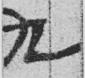九
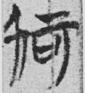○（何）
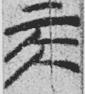天
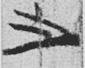之
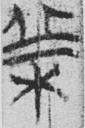○（衢）
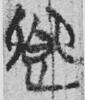卿（亨）
